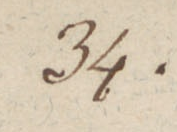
34.
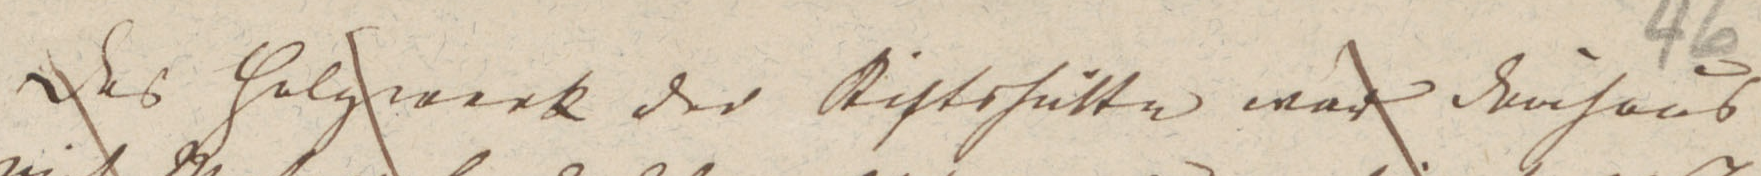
Das Holzwerk der Stiftshütte war durchaus
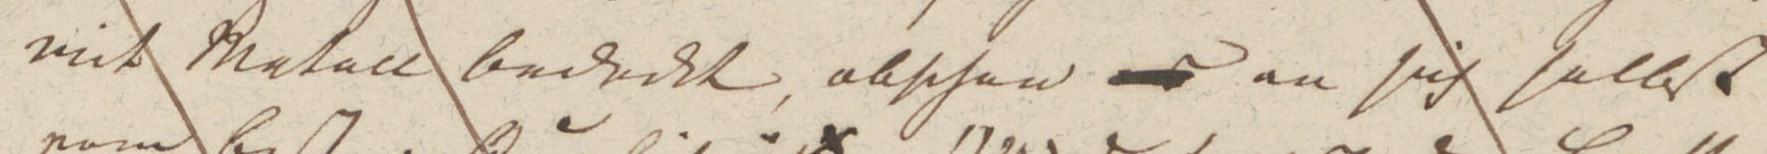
mit Metall bedeckt, obschon es an sich selbst
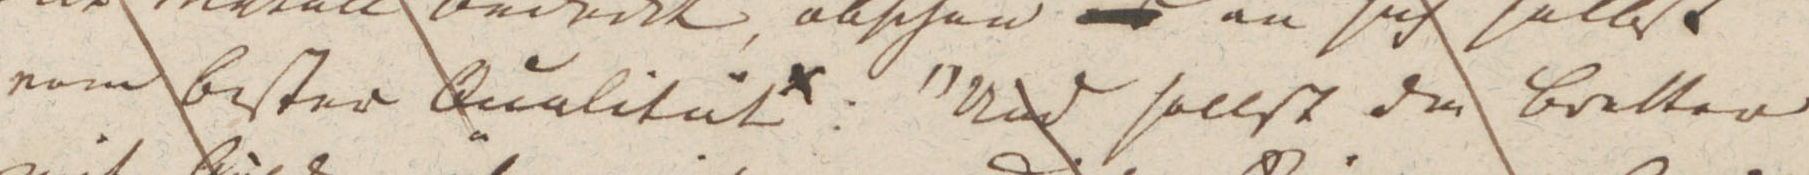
vom bester Qualität%: "Und sollst die Bretter
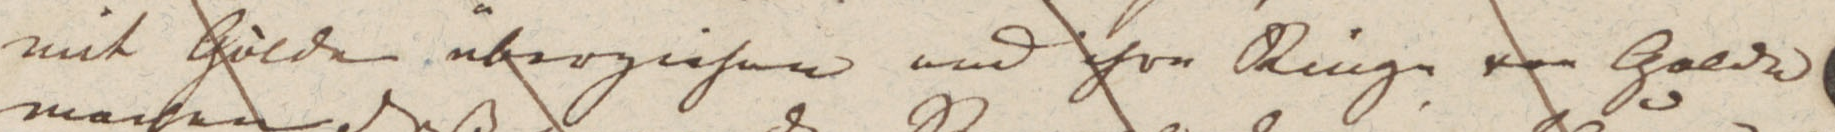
mit Glde überziehen und ihre Ringe von Golde
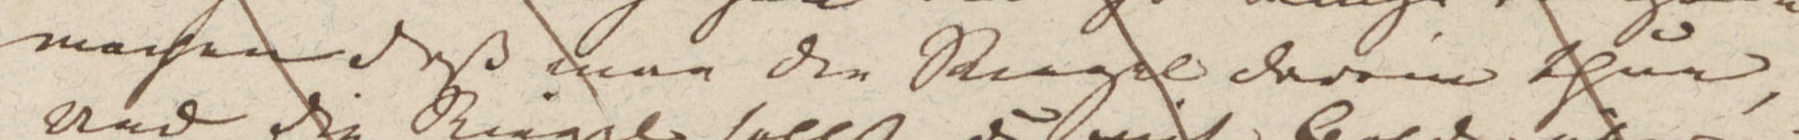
machen dass man den Riegel darein thun;
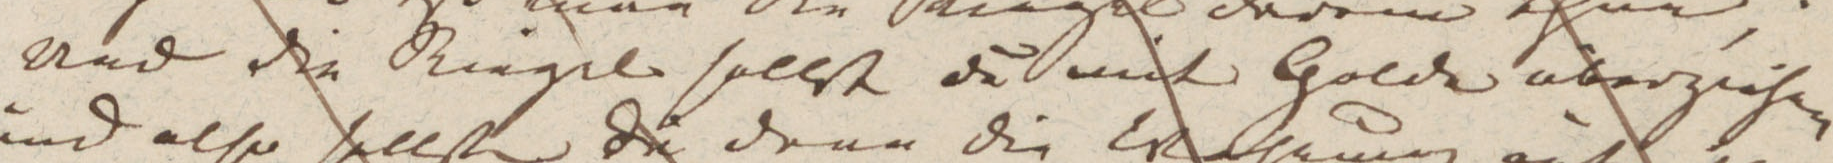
Und die Riegel sollst du mit Golde überziehen
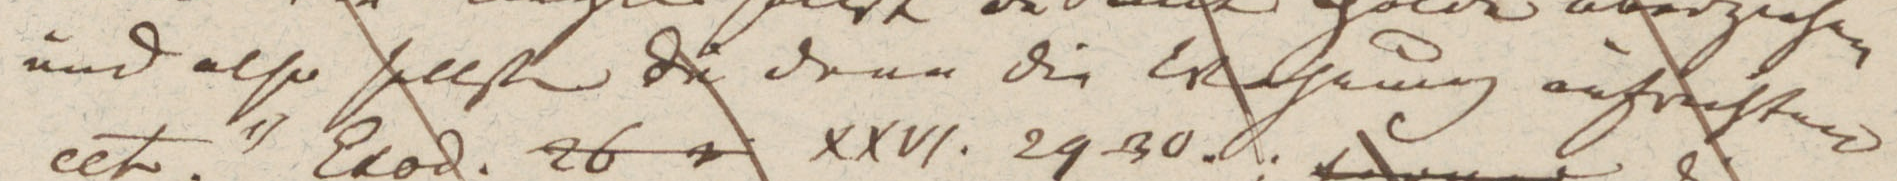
und also sollst du dann die Wohnung aufrichten
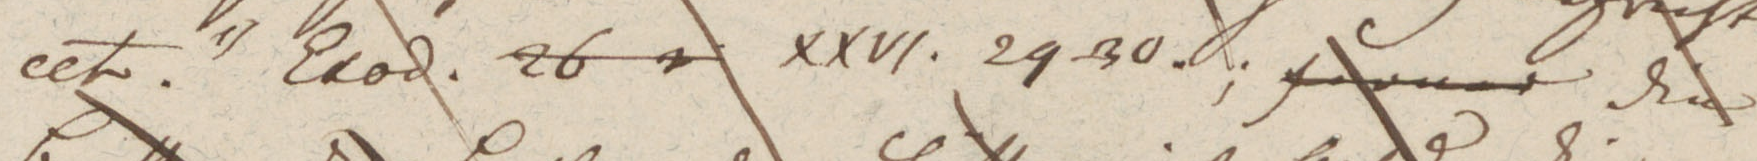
cet." Exod. 26 XXVI. 2930.; Ferner Die
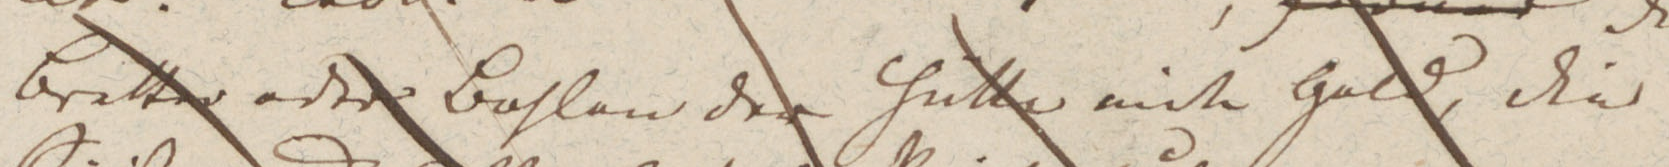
Bretter oder Bohlen der Hütte mit Gold, die
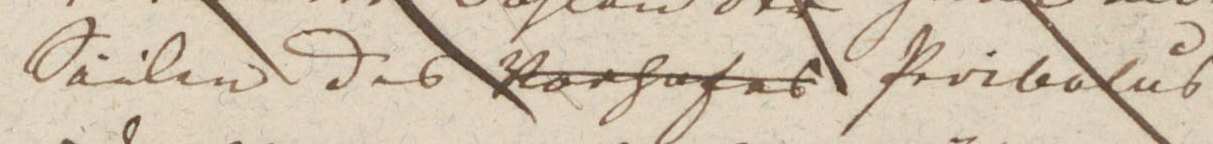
Säulen des Vorhofes Peribolus
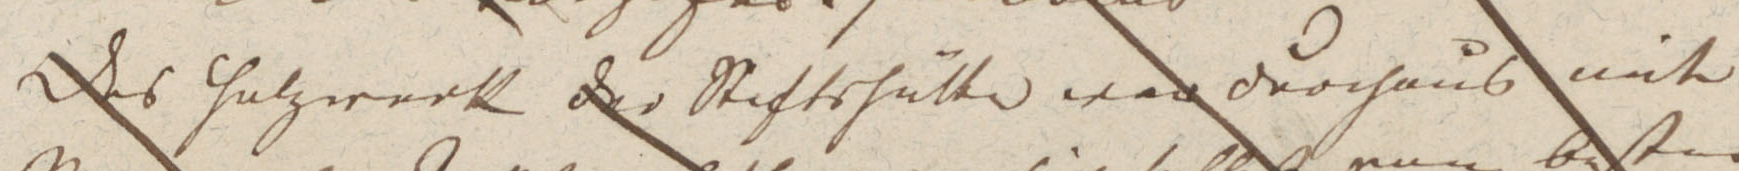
Das Holzwerk der Stiftshütte war durchaus mit
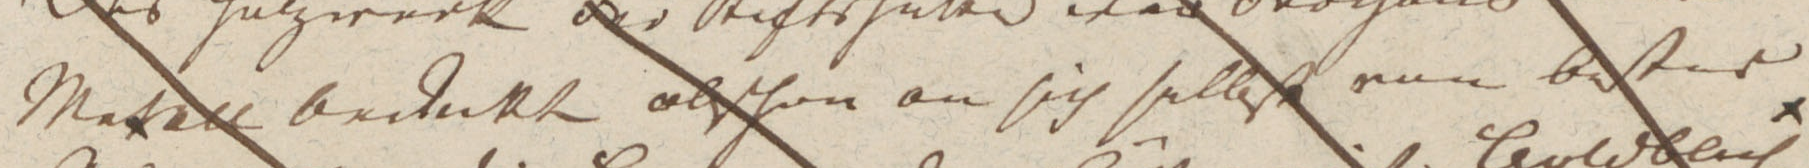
Metall bedeckt obschon an sich selbst von bester
